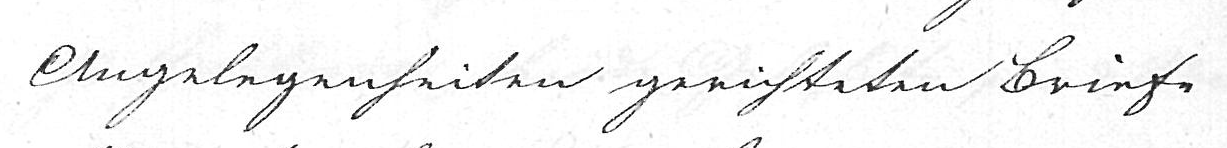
Angelegenheiten gerichteten Briefe
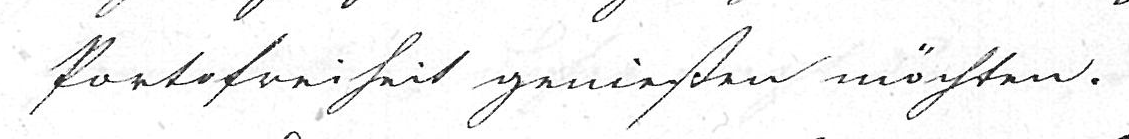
Portofreiheit genießen möchten.
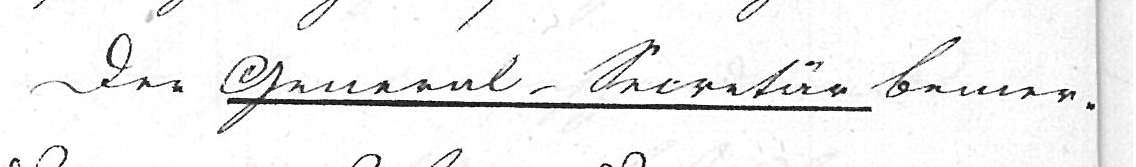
Der General-Secretär bemer-
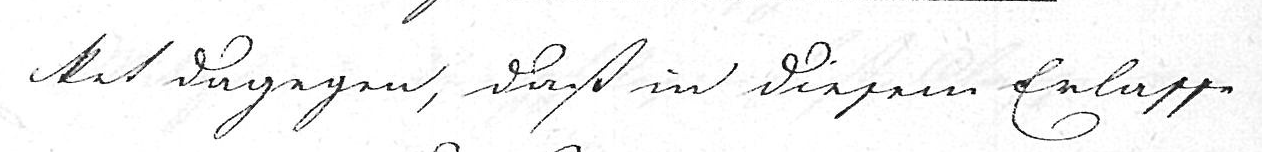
ket dagegen, daß in diesem Erlasse
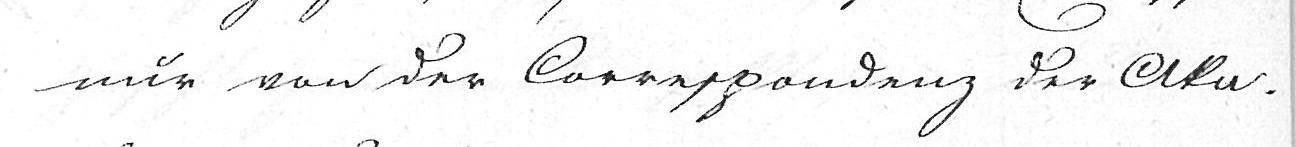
nur von der Correspondenz der Aka-
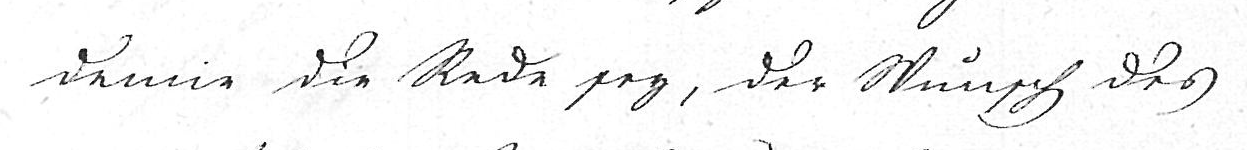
demie die Rede sey, der Wunsch des
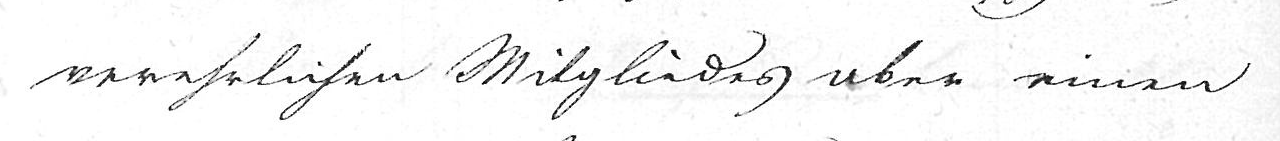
verehrlichen Mitgliedes aber einen
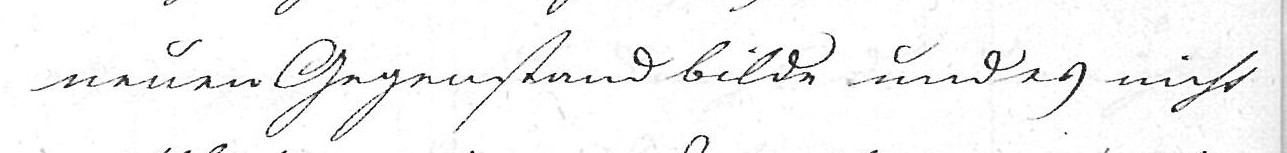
neuen Gegenstand beide und es nicht
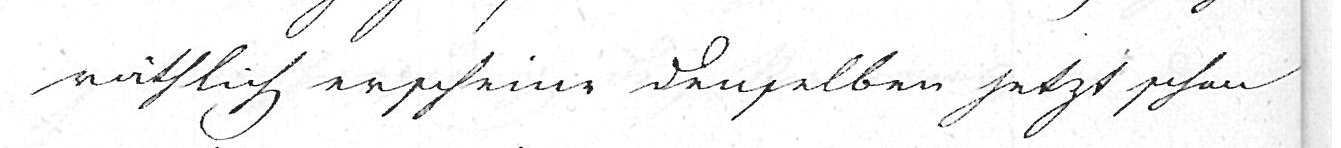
räthlich erscheine denselben jetzt schon
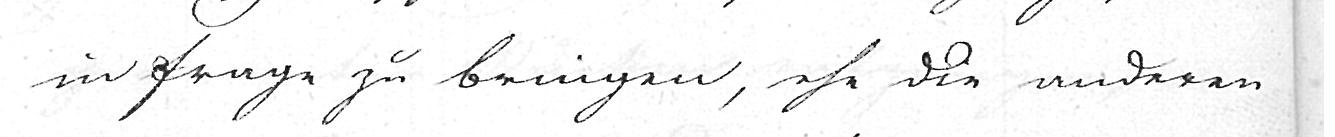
in Frage zu bringen, ehe die anderen
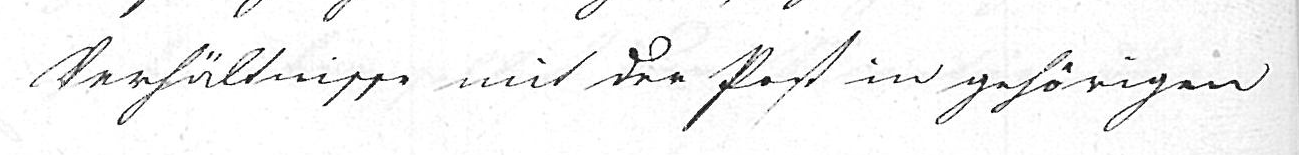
Verhältnisse mit der Post in gehörigen
